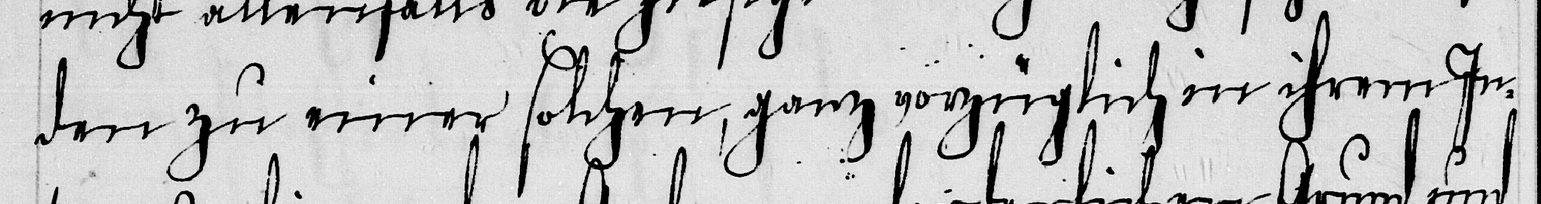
den zu einer solchen, ganz vorzüglich in ihrem In¬
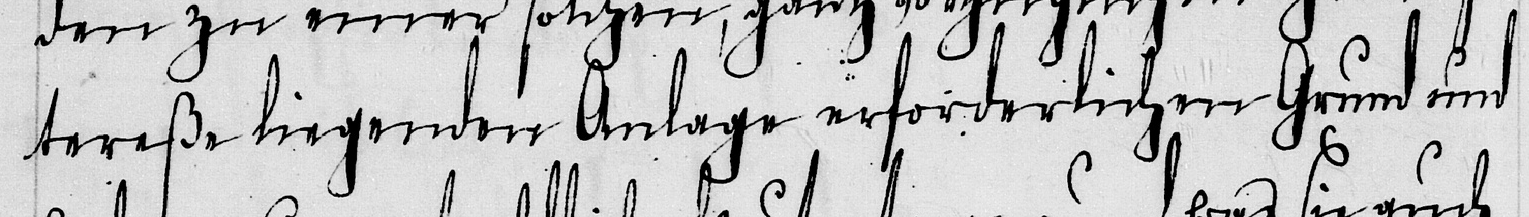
tereße liegenden Anlage erforderlichen Grund und
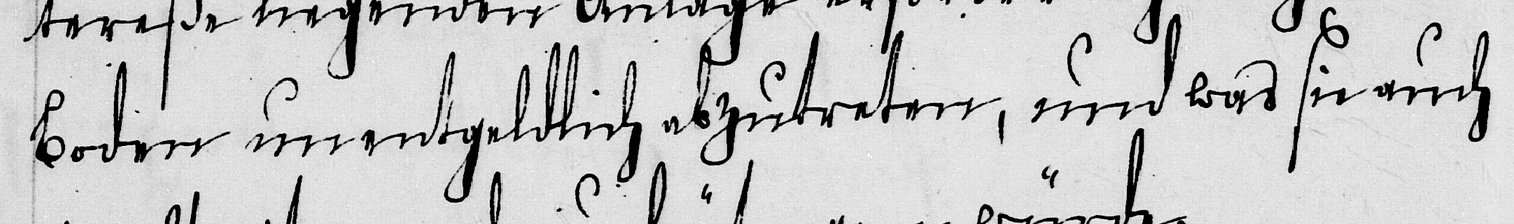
Boden unentgeldlich abzutreten, und was sie auch
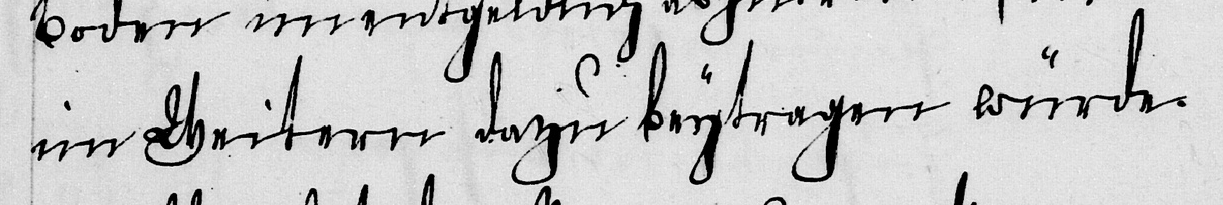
im Weitern dazu beytragen würde.
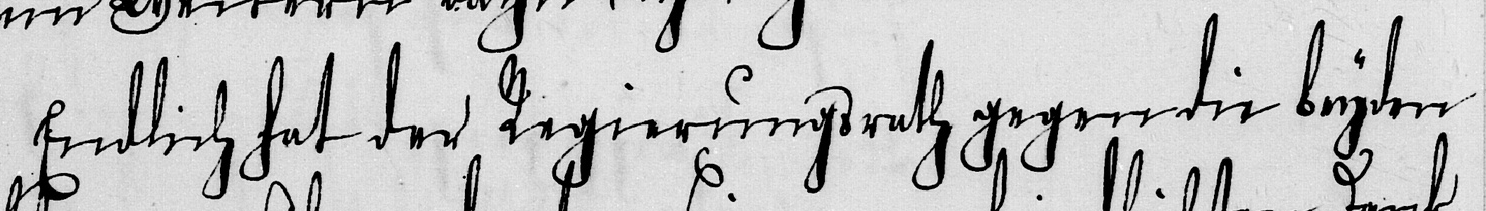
Endlich hat der Regierungsrath gegen die beyden
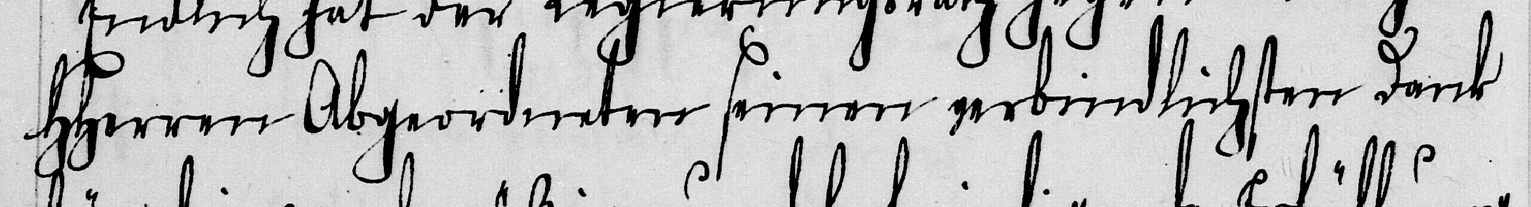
HHerren Abgeordneten seinen verbindlichen Dank
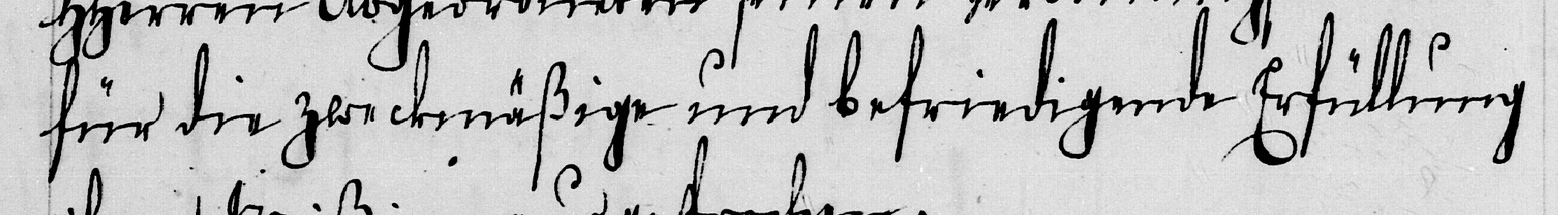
für die zweckmäßige und befriedigende Erfüllung
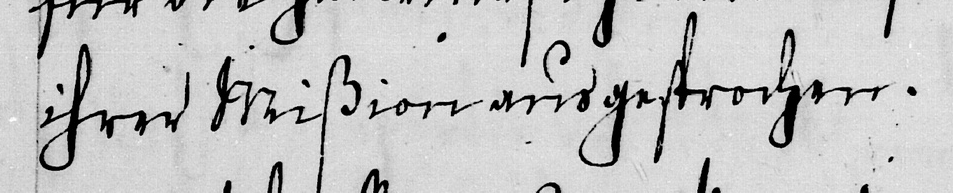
ihrer Mißion ausgesprochen.
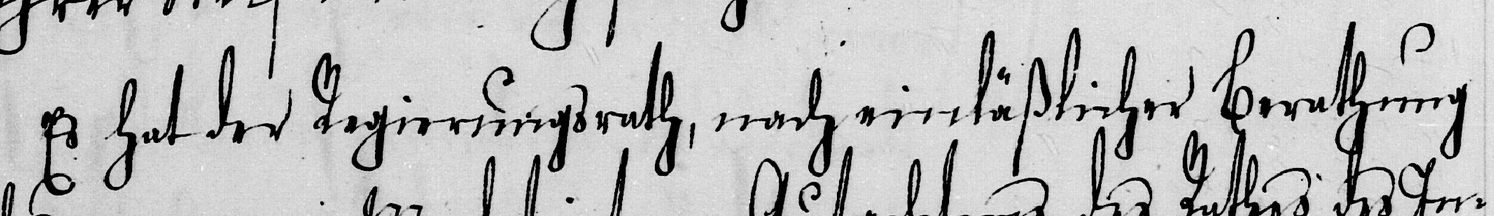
Es hat der Regierungsrath, nach einläßlicher Berathung
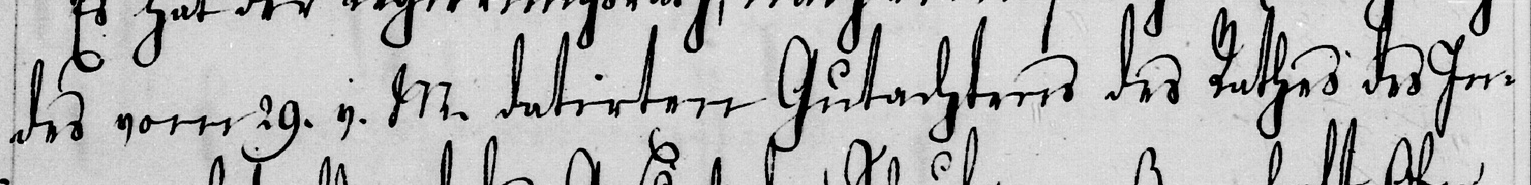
des vom 29. v. M. datirten Gutachtens des Rathes des In¬
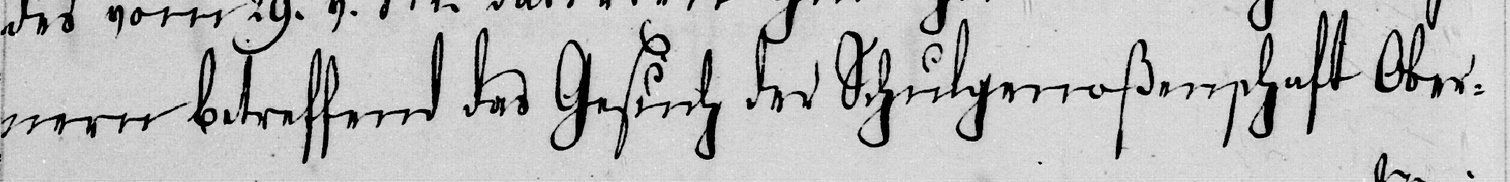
nern betreffend das Gesuch der Schulgenoßenschaft Ober-
